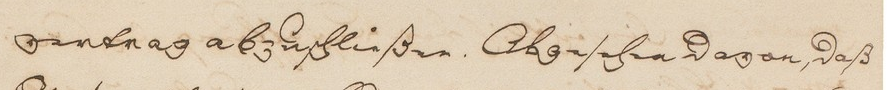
vertrag abzuschließen. Abgesehen davon, daß
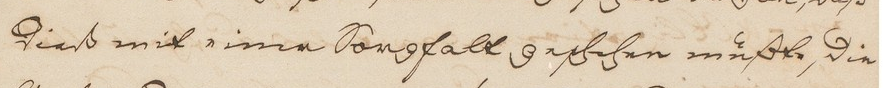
dieß mit einer Sorgfalt geschehen müßte, die
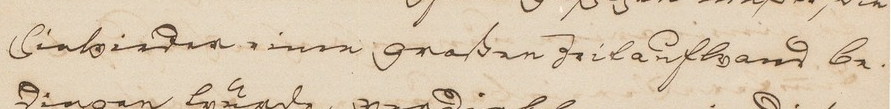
hinwieder einen großen Zeitaufwand be-
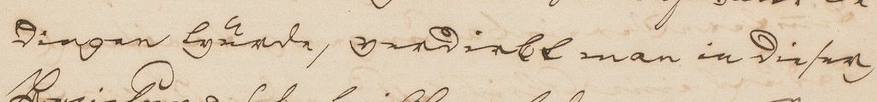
dingen würde, verdirbt man in dieser
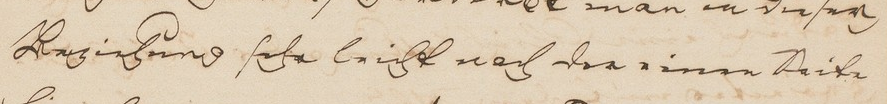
Beziehung sehr leicht nach der einen Seite
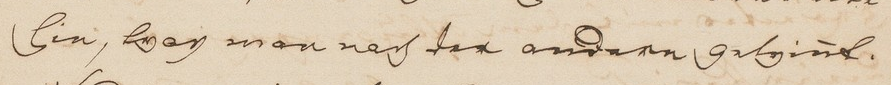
hin, was man nach der anderen gewinnt.
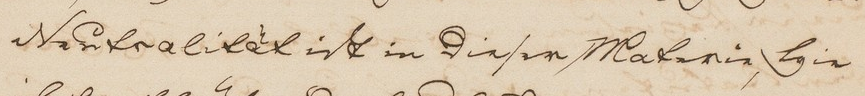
Neutralität ist in dieser Materie, wie
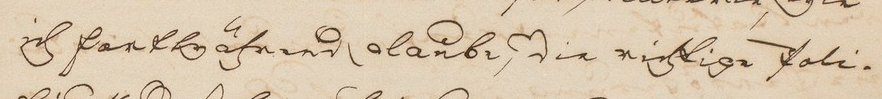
ich fortwährend glaube, die richtige Poli-
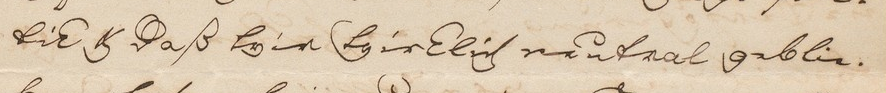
tik & daß wir wirklich neutral geblie-
